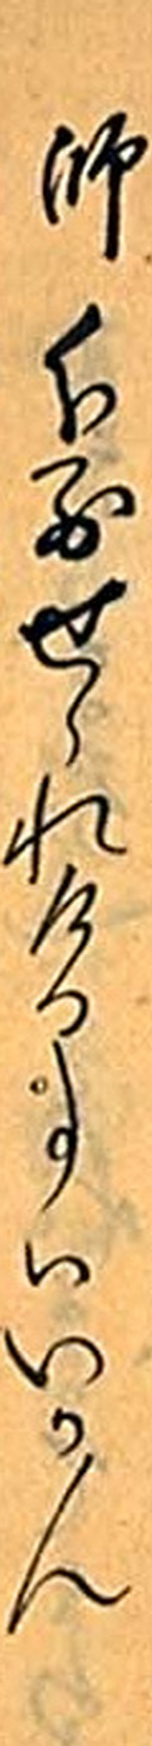師分別せられける事はいかん
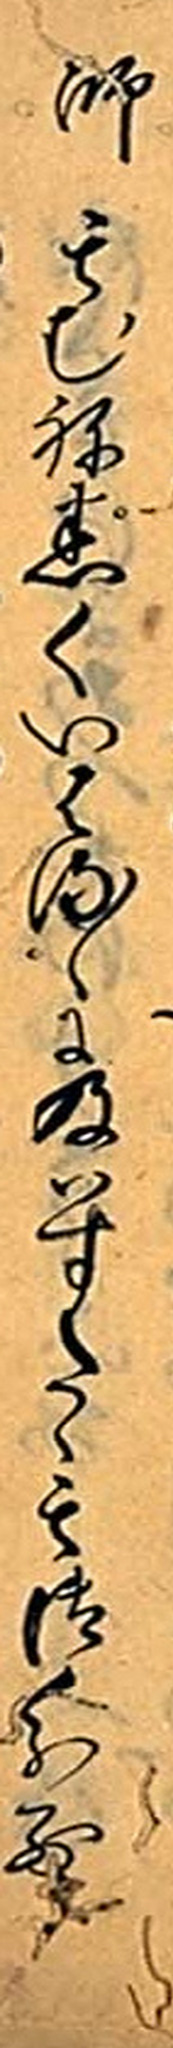師其むね悉くいはるゝに及はすたゝ其御分別
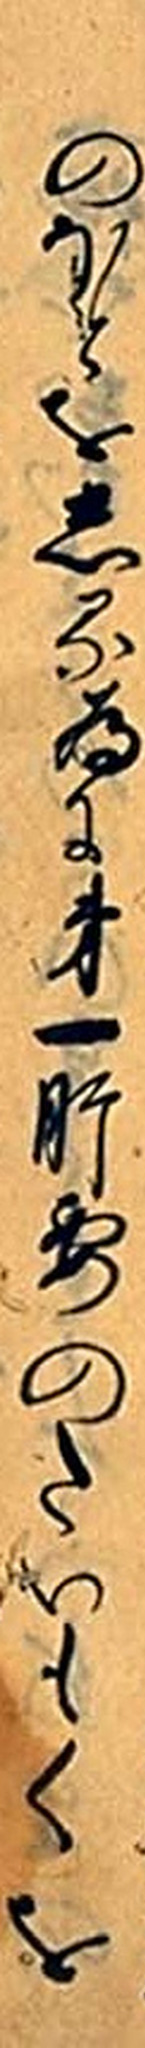のほとをしる為に第一肝要のたいもくを
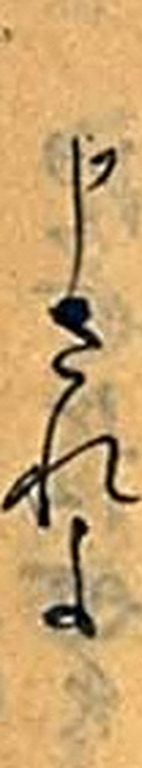申されよ
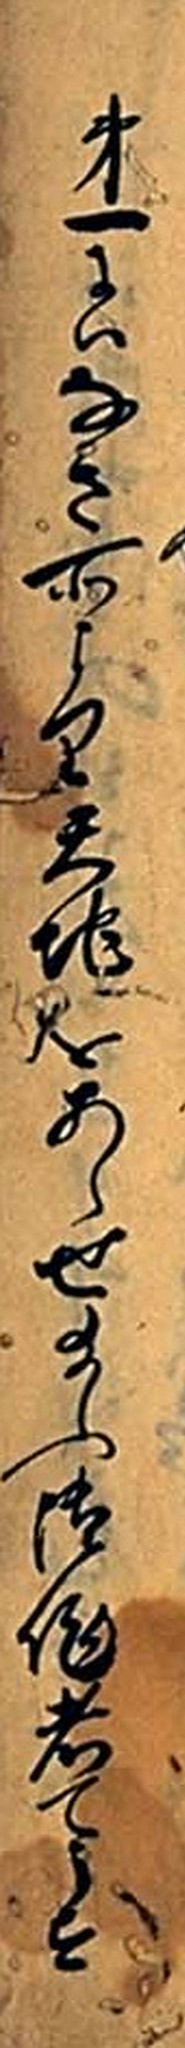弟一にはなき所より天地をあらせ給ふ御作者てうす

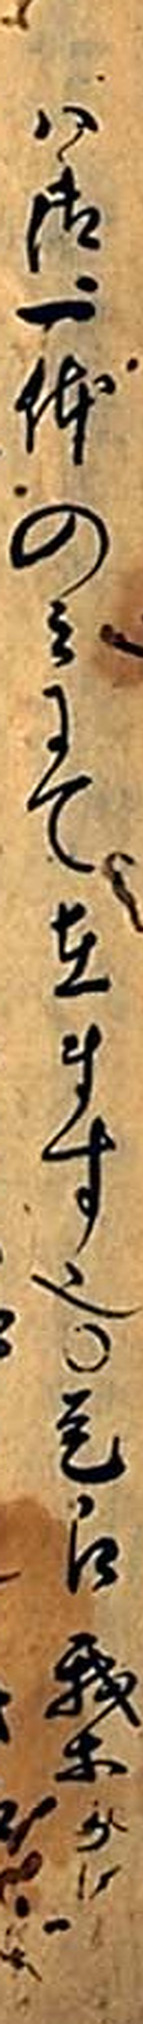は御一体のみにて在ます也○是即我等か
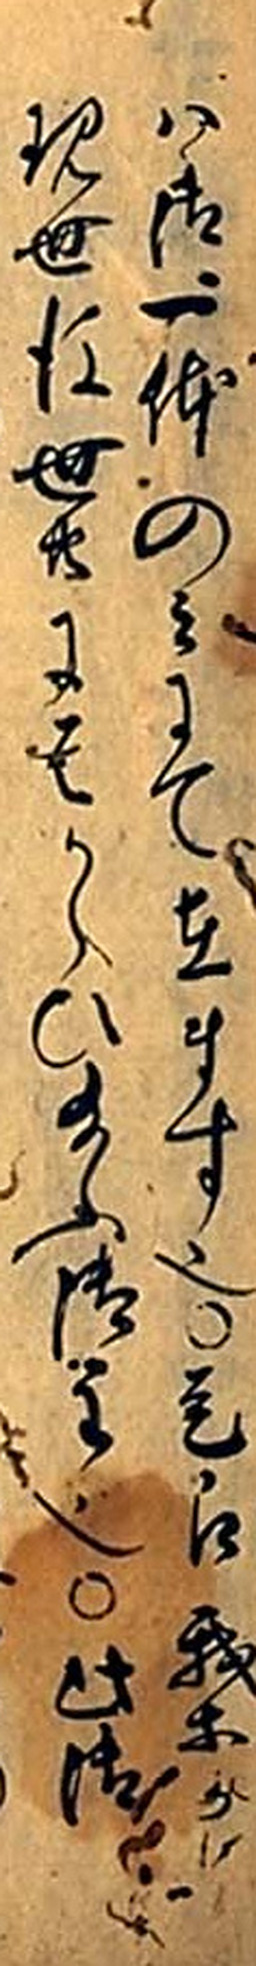現世後世共にはからひ給ふ御主也○此御
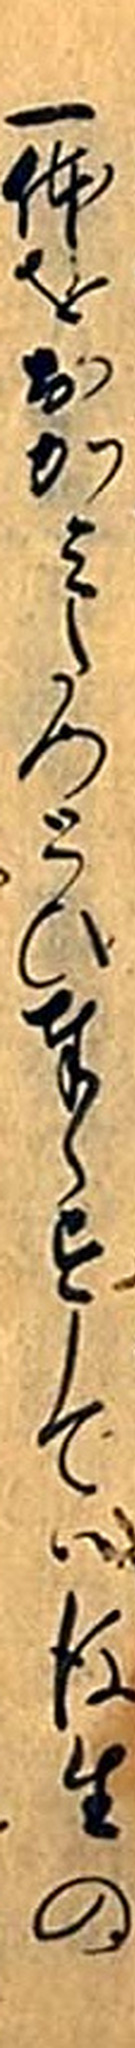一体をおかみたつとひ奉らすしては後生の
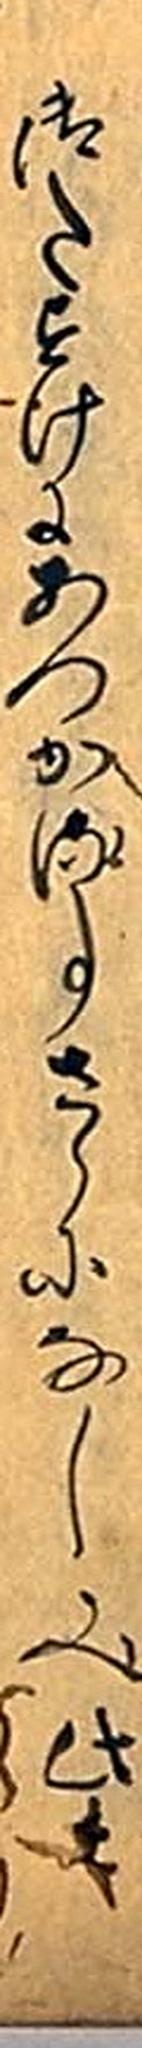御たすけにあつかる事さらになし又此も
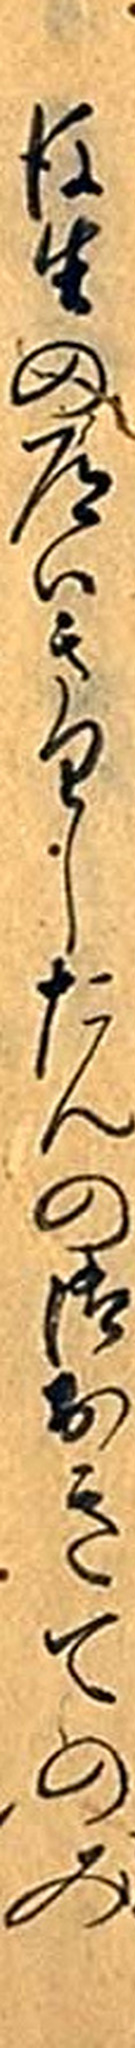後生の道はきりしたんの御おきてのみ
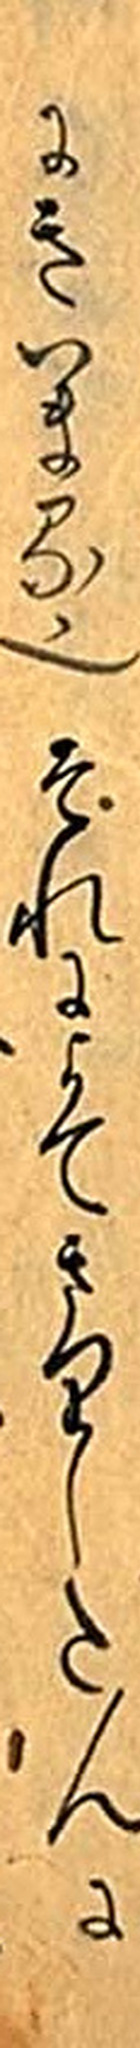にきはまる也それによてきりしたんに
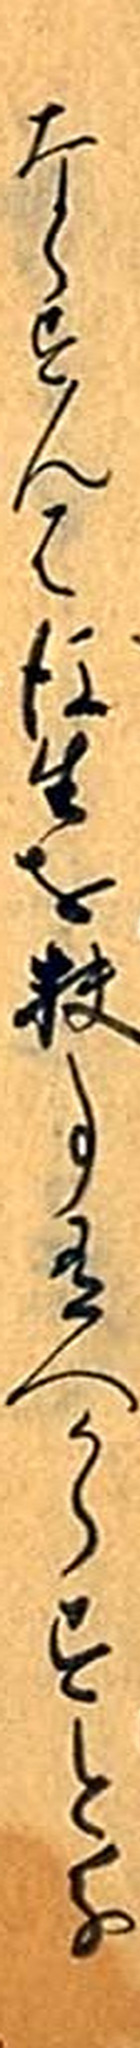ならすんは後生を扶事有へからすと分
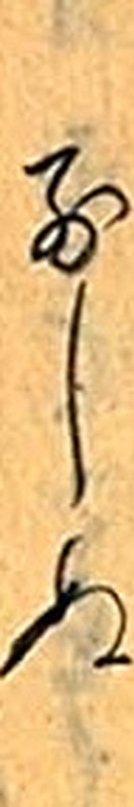別しぬ
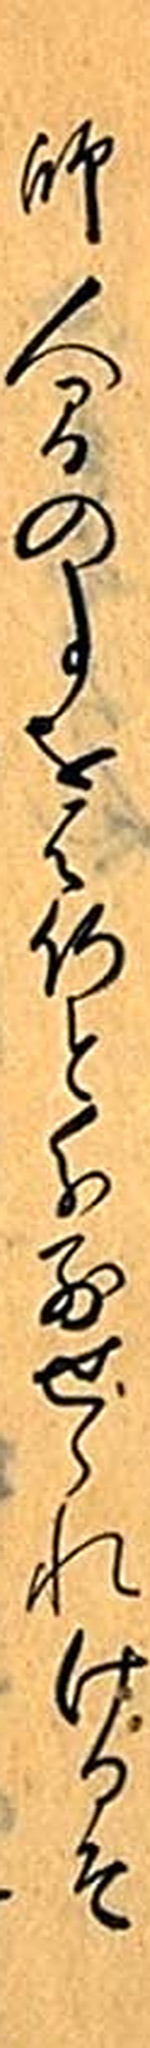師人間の事をは何と分別せられけるそ
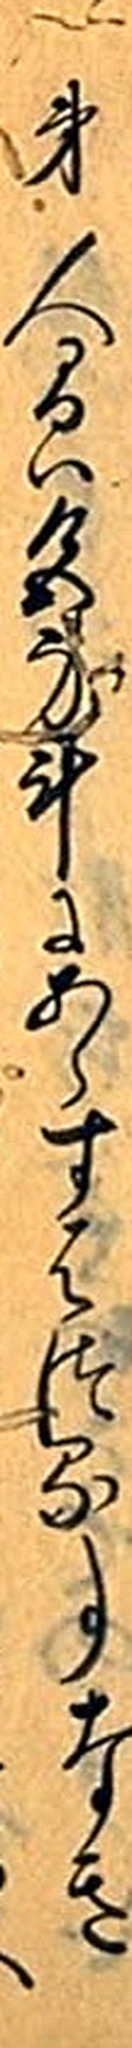弟人間は色身計にあらすはつる事なき
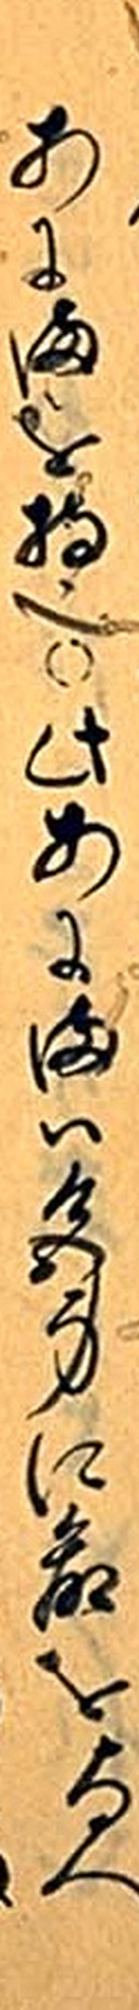あにまを持也○此あにまは色身に命を与へ
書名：ドチリナ・キリシタン
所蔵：東京大学総合図書館 / General Library in the University of Tokyo
